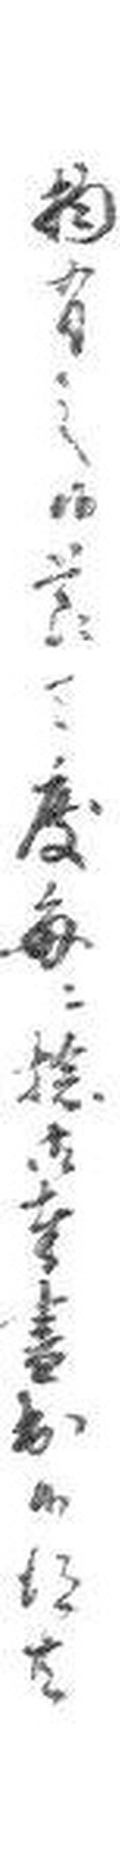物有之候節者度毎ニ捻御奉書出候得共
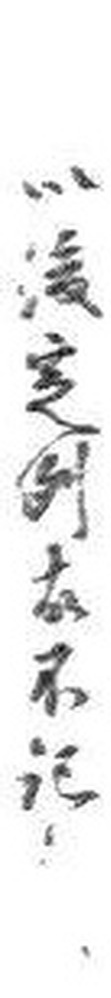以後定例故不記之
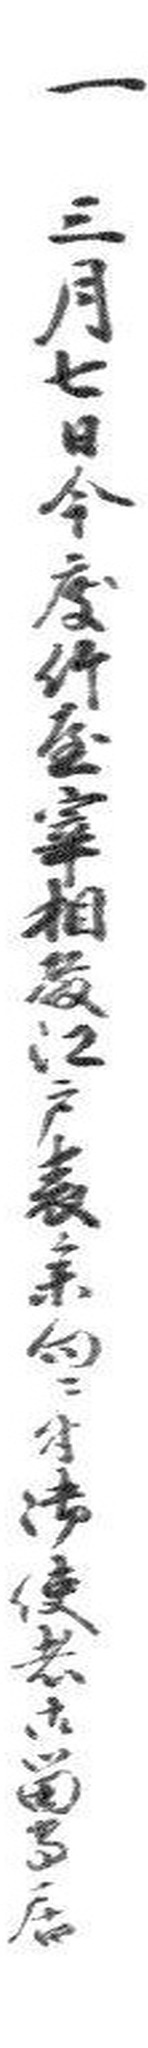一三月七日今度竹屋宰相殿江戸表参向ニ付御使者御留守居

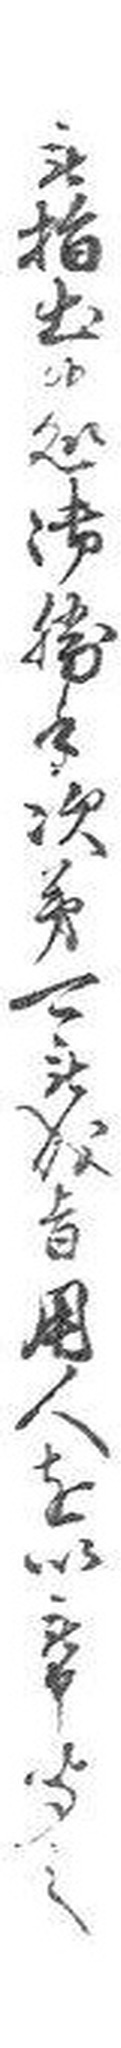被指出候処御勝手次第可被成旨用人を以被申聞之
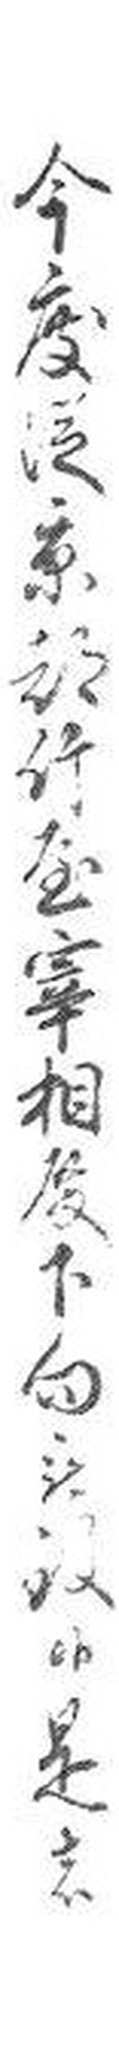今度従京都竹屋宰相殿下向被致候是者
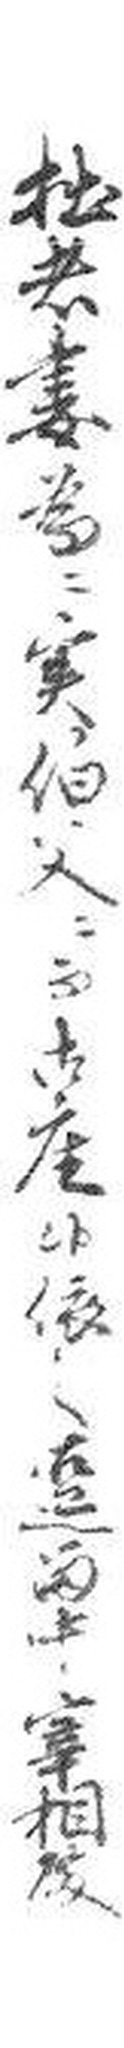拙者妻為ニ実伯父ニ而御座候依之逗留中宰相殿
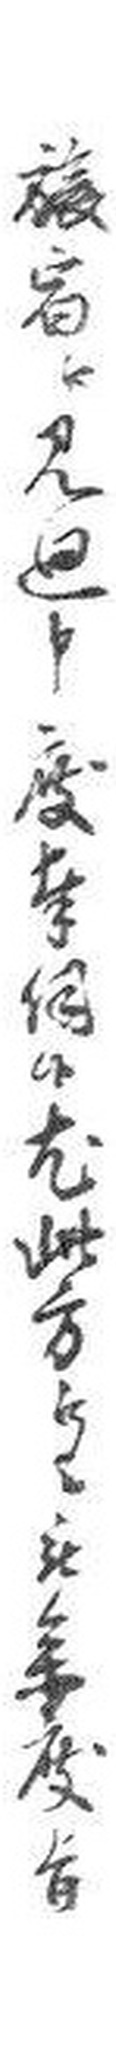旅宿江見廻申度奉伺候尤此方江も被参度旨
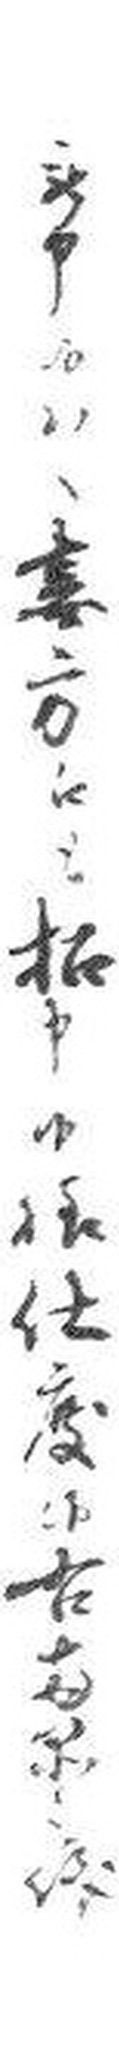被申候ハゝ妻方江も招申候様仕度候右両品之儀
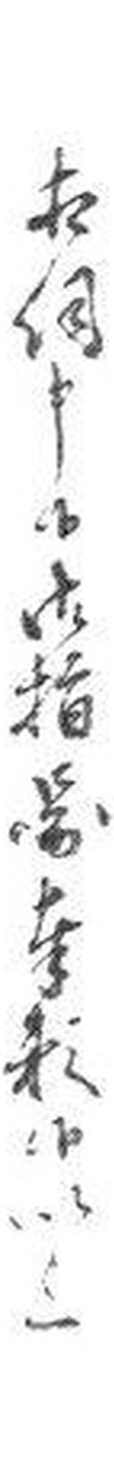相伺申候御指図奉頼候以上
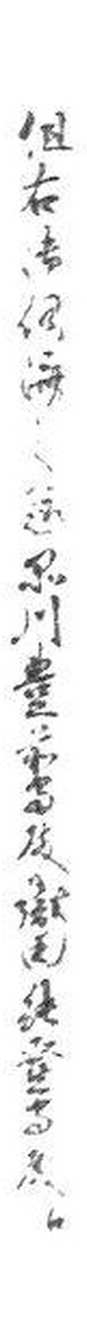但右御伺済之趣品川豊前守殿織田能登守殿江
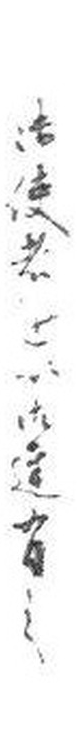御使者を以御達有之
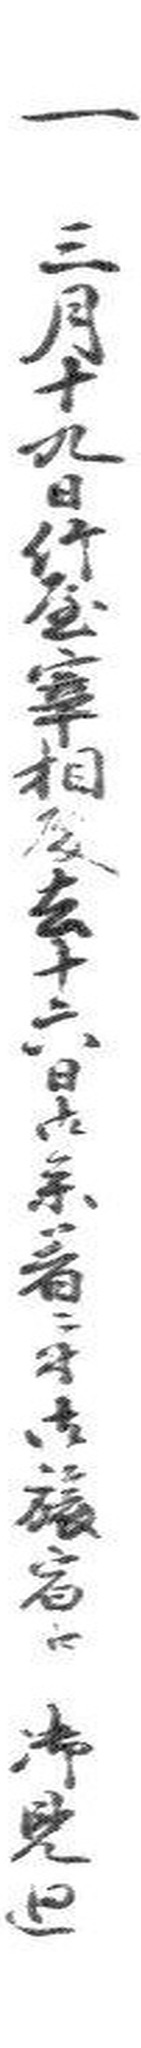一三月十九日竹屋宰相殿去十六日御参着ニ付御旅宿江御見廻
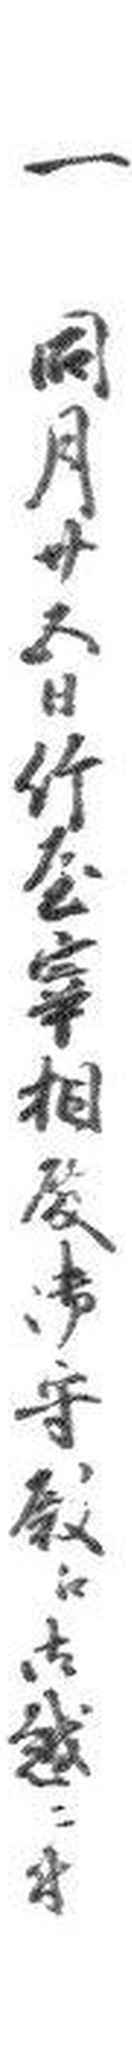一同月廿五日竹屋宰相殿御守殿江御越ニ付
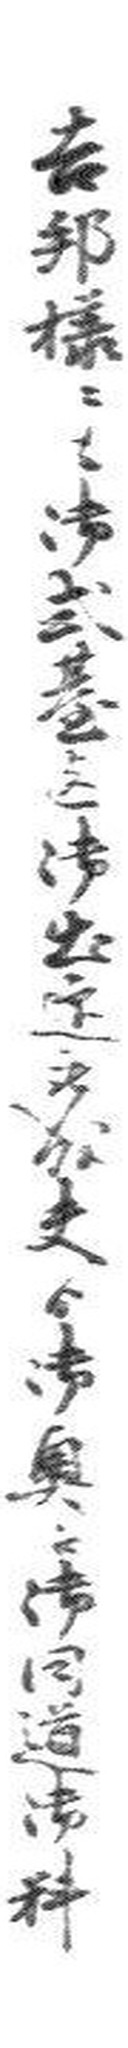吉邦様ニも御式台迄御出迎被成夫ゟ御奥江御同道御料
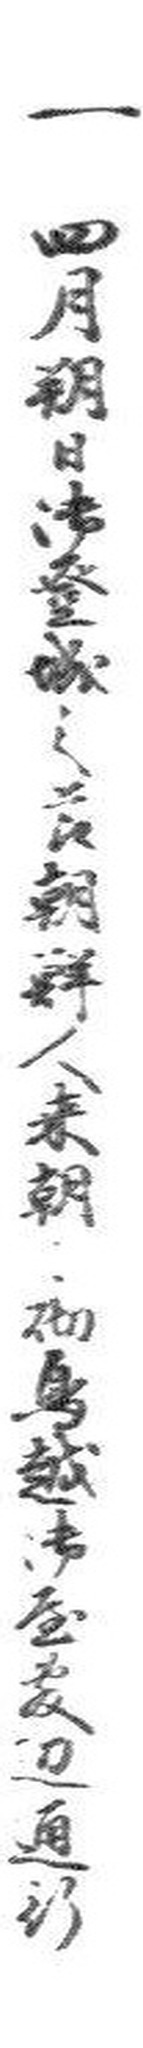一四月朔日御登城之節朝鮮人来朝之砌鳥越御屋敷辺通行
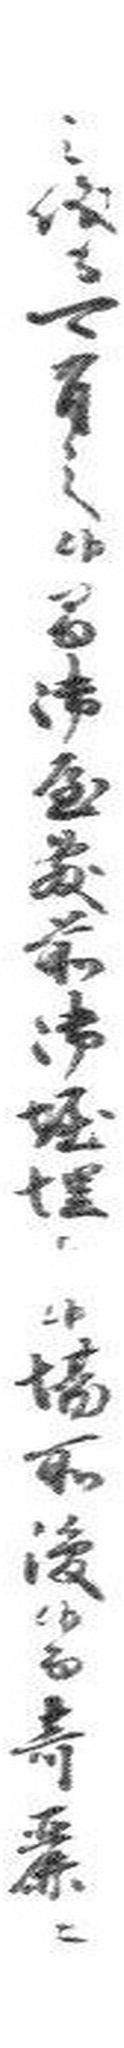之儀も可有之候間御屋敷前御堀埋り候場所浚候而奇麗ニ
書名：家譜 二十八 吉邦公 従宝永七年七月五日到正徳元年十二月
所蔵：福井県文書館 Fukui Prefectural Archives
